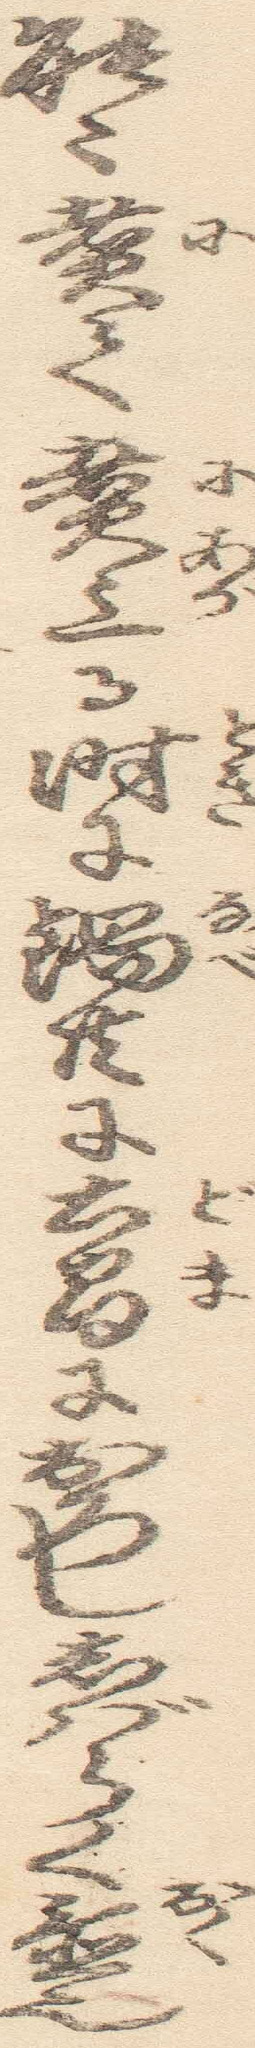能々煮て煮上る時に鍋共に土間におろししばらく置也
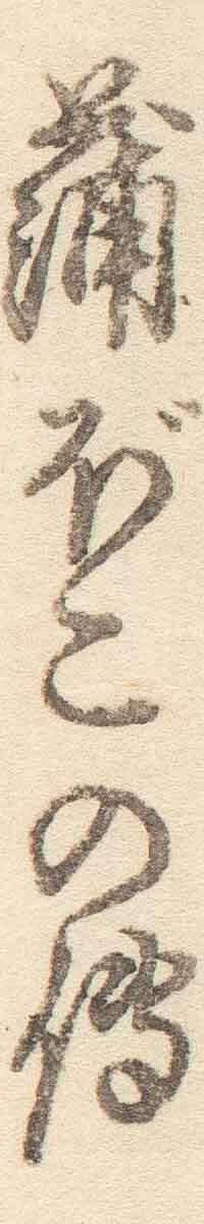蒲ぼこの伝
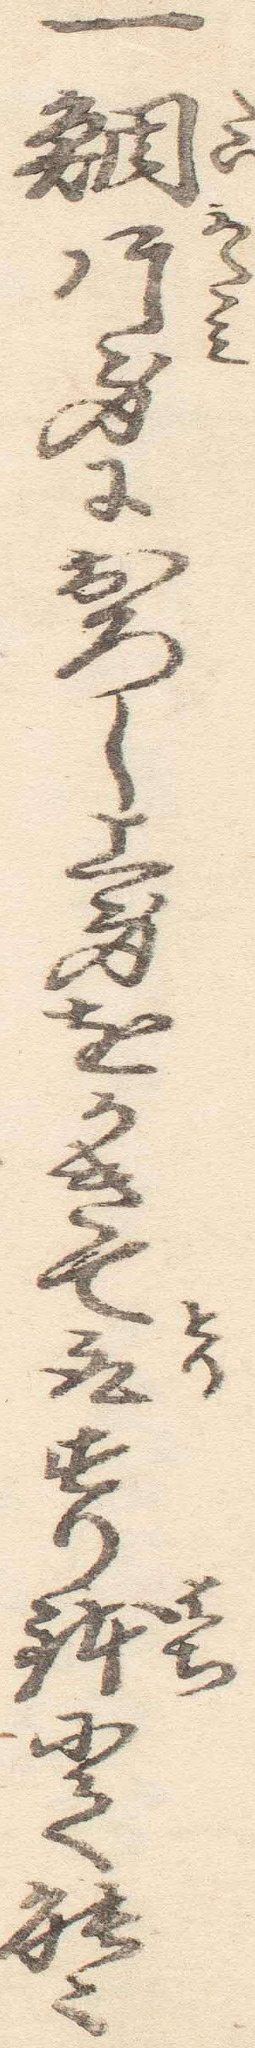一鯛片身におろし上身をかきて取すり鉢にて能々
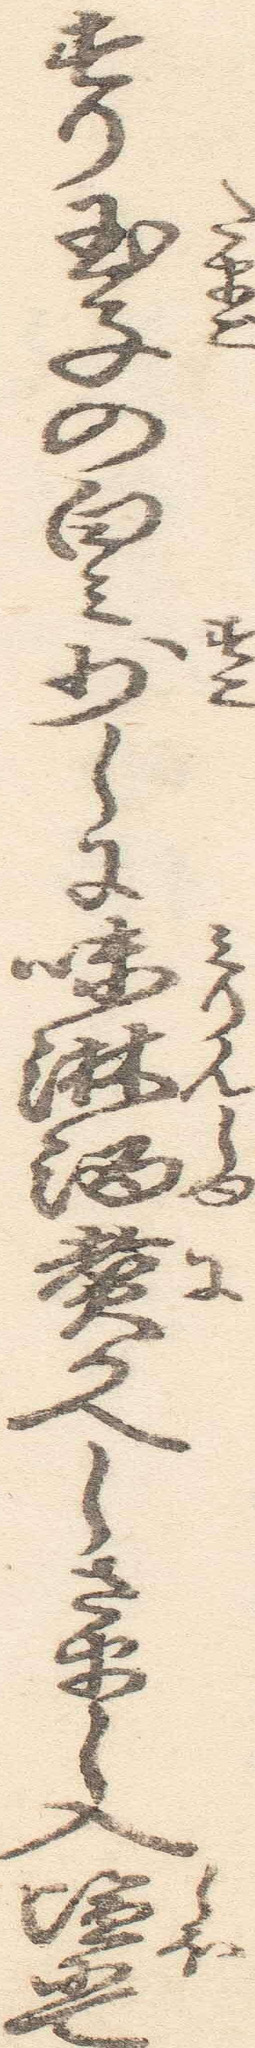すり玉子の白み少しに味淋酒煮かへしさまし入塩にて
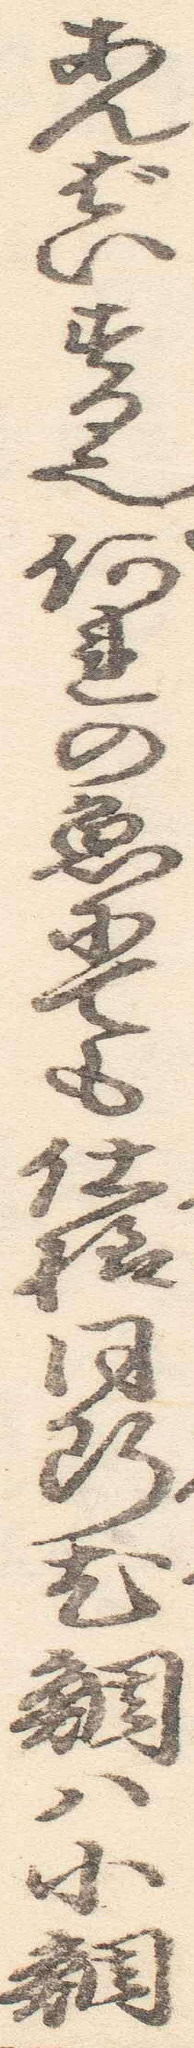あんばいする也何れの魚にても仕様同断尤鯛は小鯛
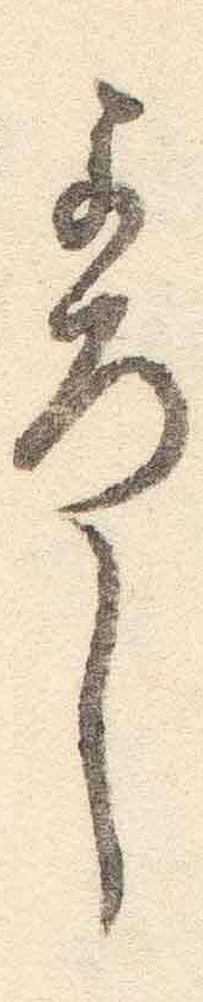よろし
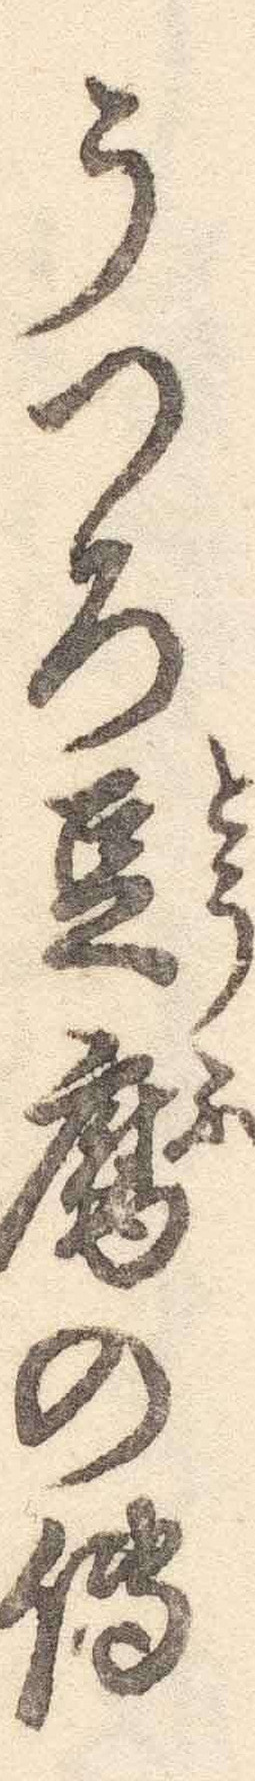うつろ豆腐の伝
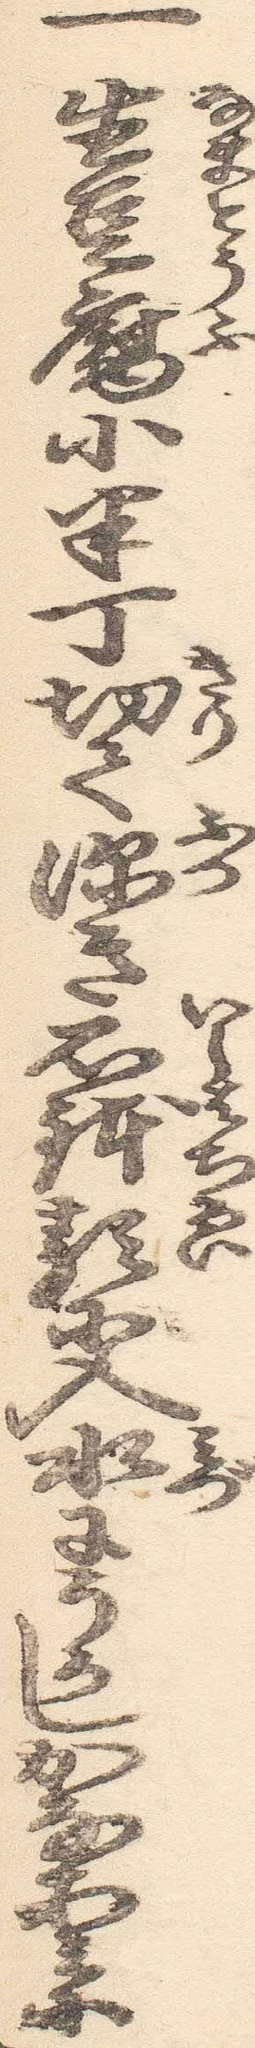一生豆腐小半丁切て深き石鉢類に入水にうかしかなあみに
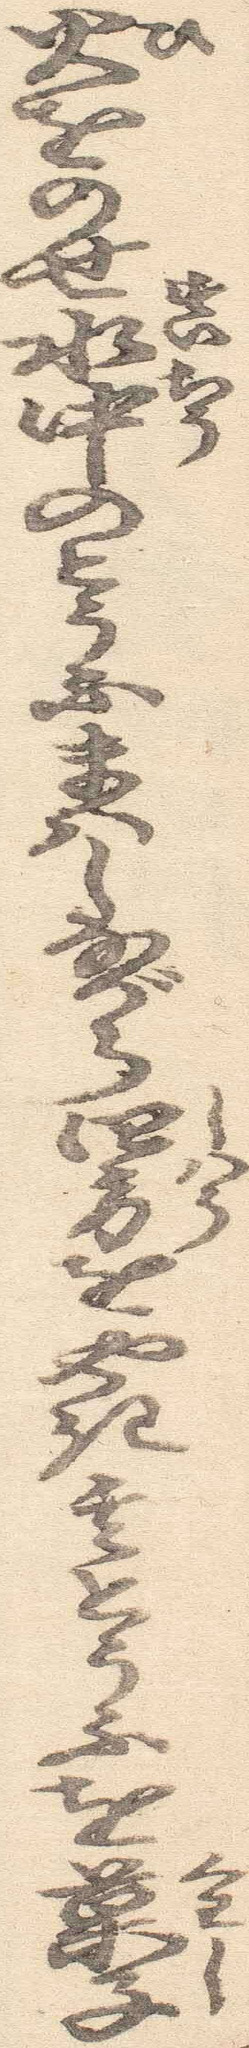火をのせ水中のとうふまはしながら四方をやき其とうふを菓子
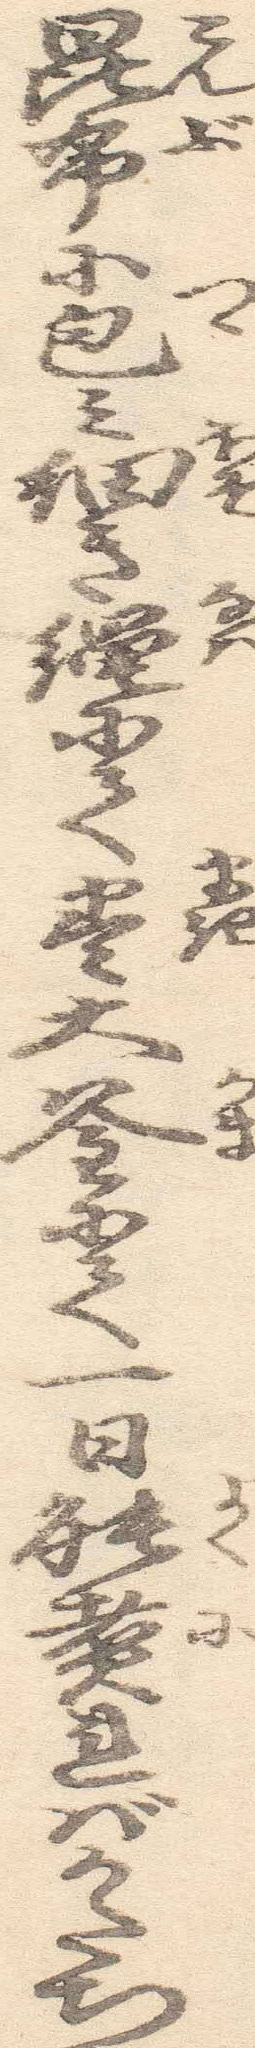昆布に包み細き縄にて巻大釜にて一日能煮ればかたち
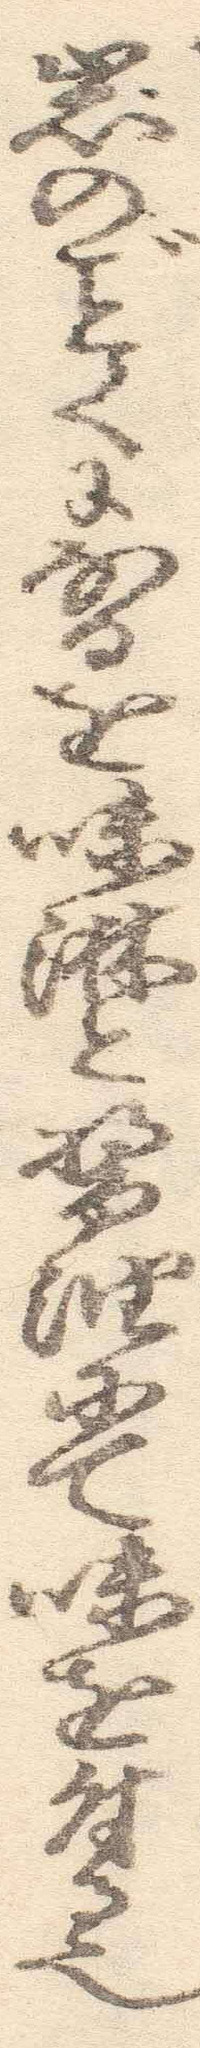岩のごとくになるを味淋と醤油にて味を付る也
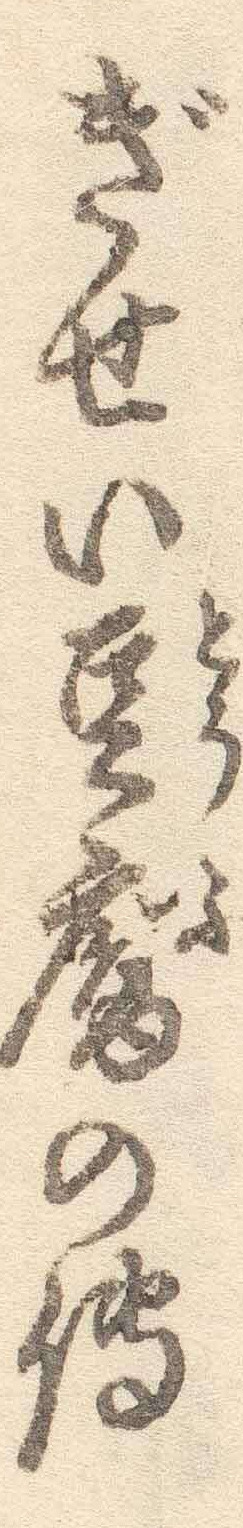ぎせい豆腐の伝
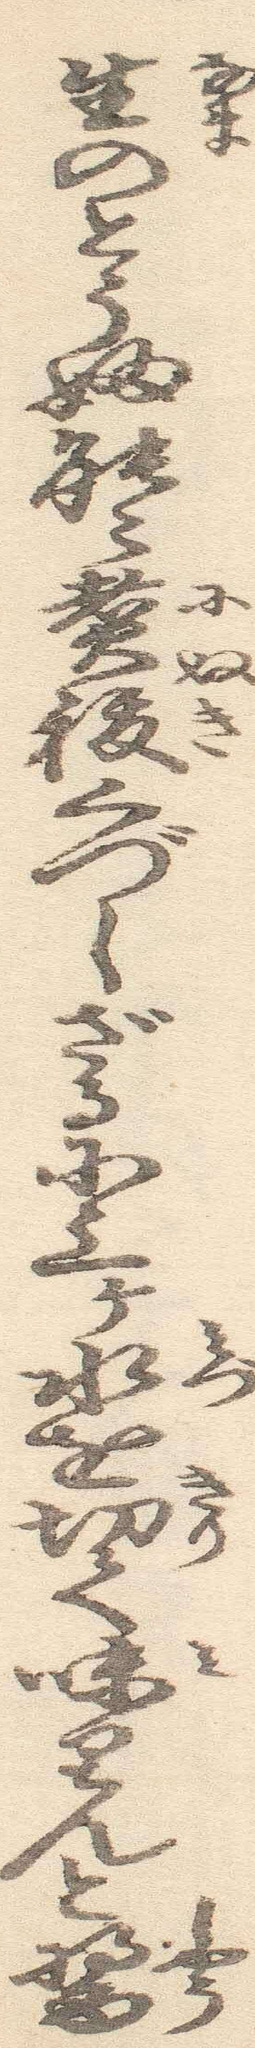一生のとうふ能々煮抜くづしざるに上け水を切て味りんと醤
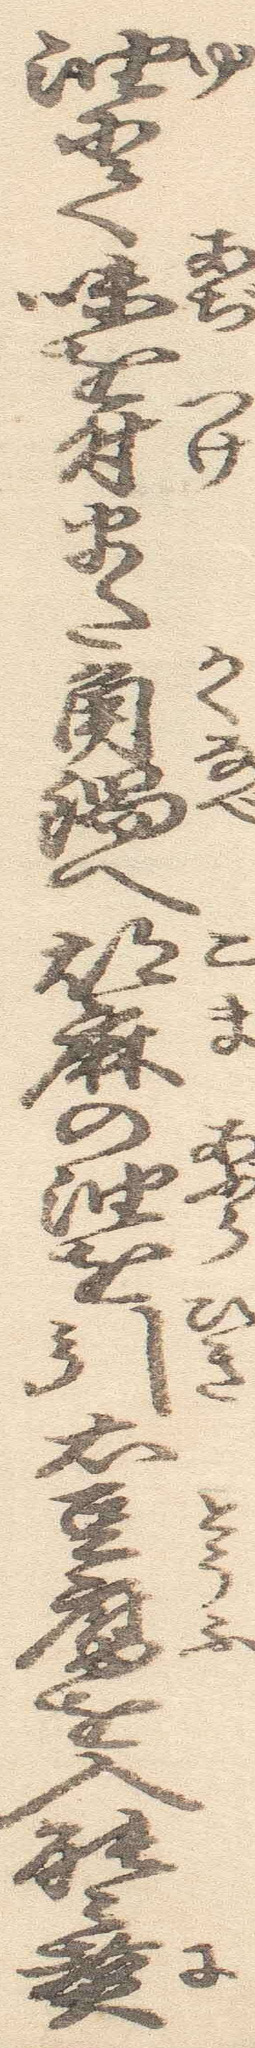油にて味を付また角鍋へ胡麻の油を引右豆腐を入能々煮
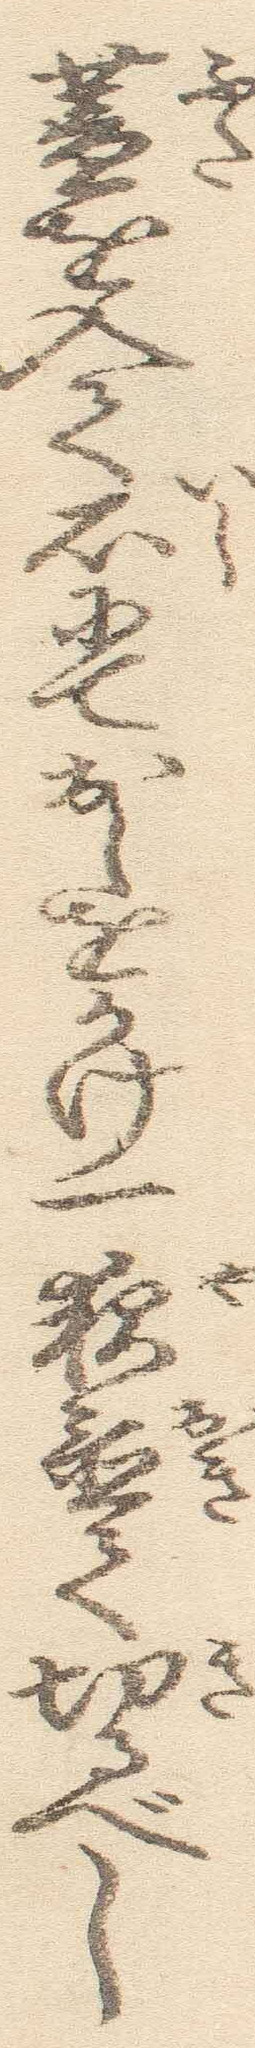蓋を入て石にておしをかけ一夜置て切るべし
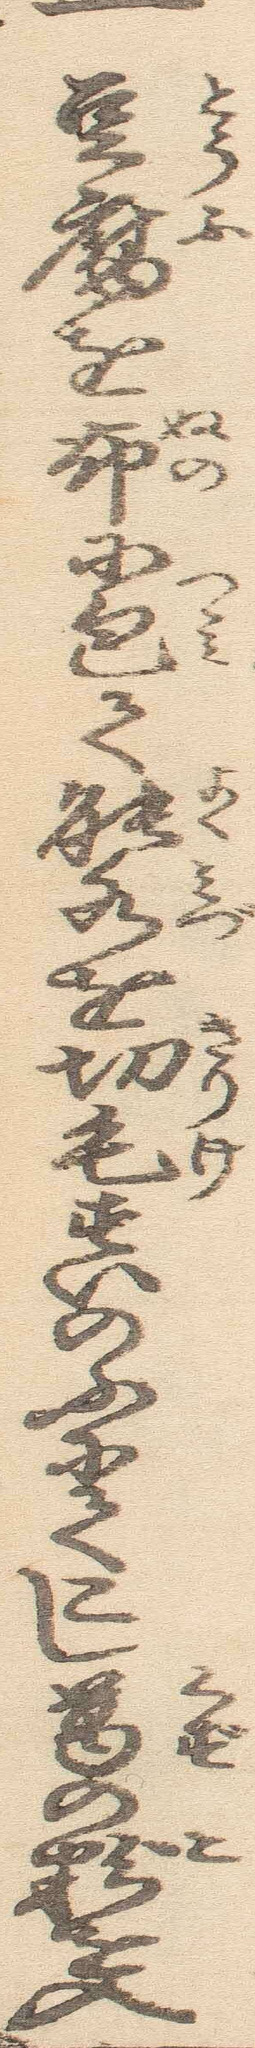一豆腐を布に包て能水を切毛すいのふにてこし葛の粉を入
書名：料理通
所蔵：東京学芸大学附属図書館 国文学研究資料館
